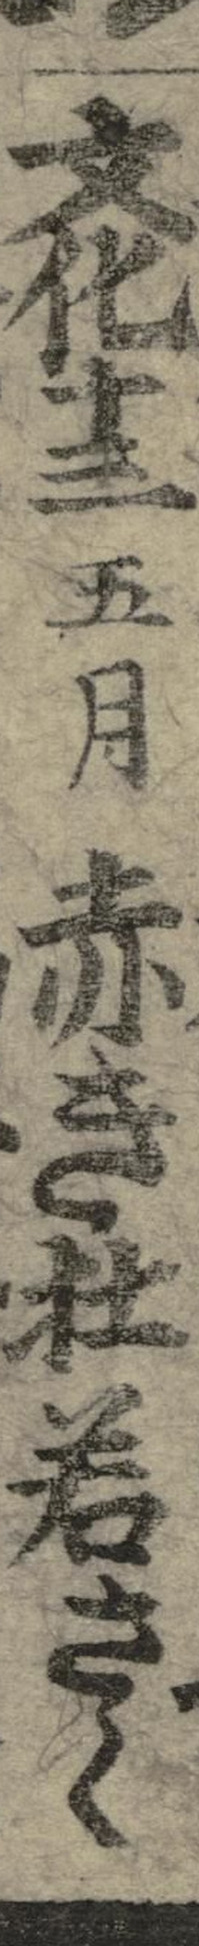文化十三五月赤き杜若さく
